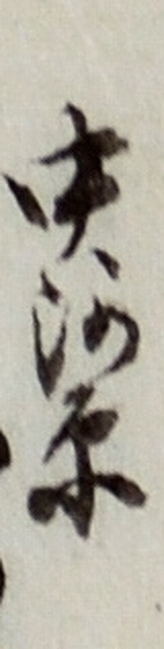中河原
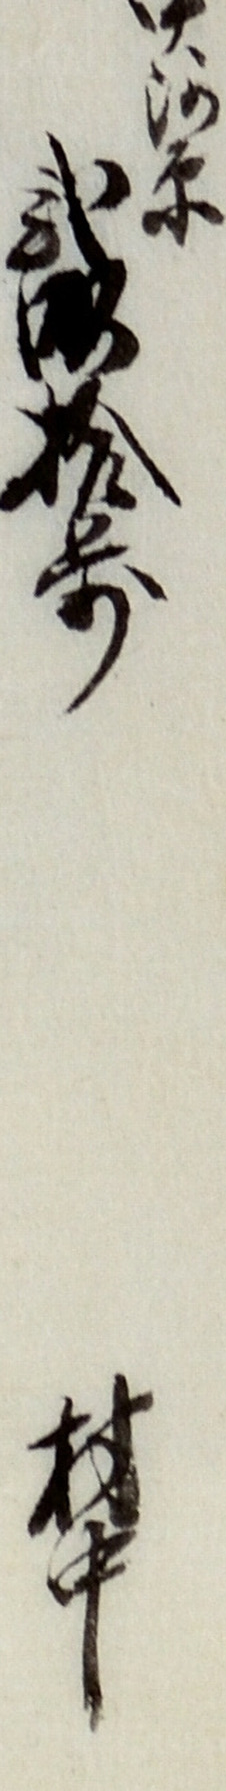弐畝拾歩村中
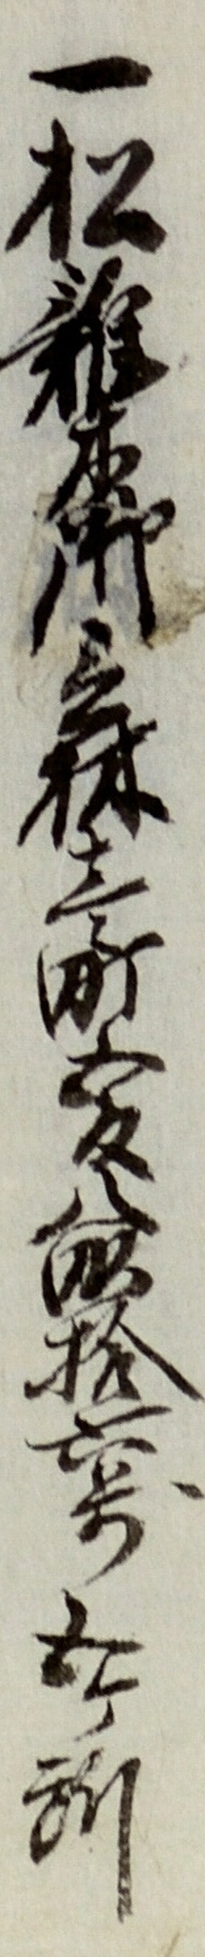一松雑木御立林壱町五反八畝拾六歩五ヶ所
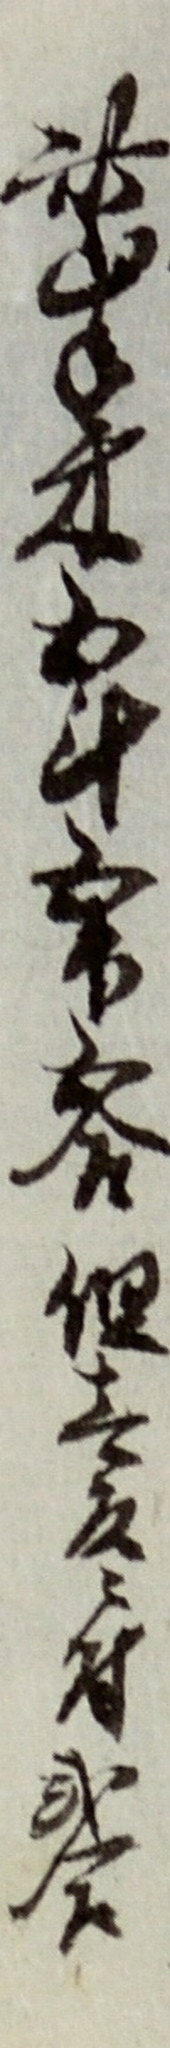此山手米五斗五升五合但壱反ニ付弐合

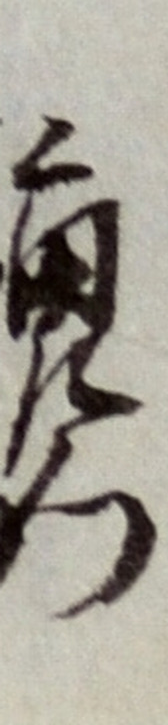善左衛門
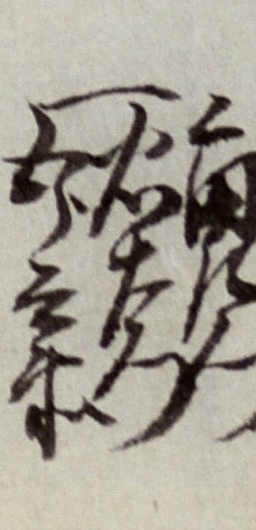忠右衛門
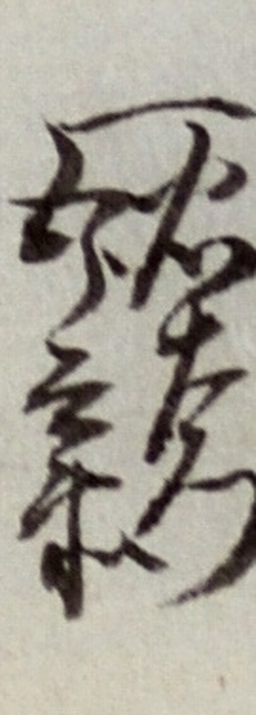五郎兵衛
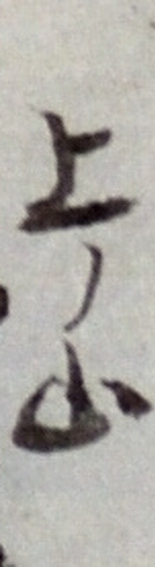上ノ山
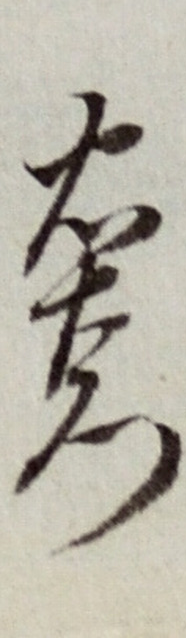忠右衛門
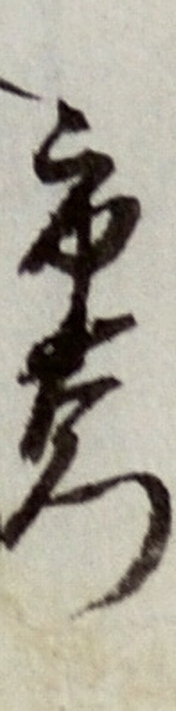忠右衛門
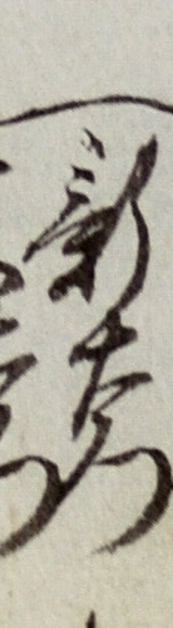忠右衛門
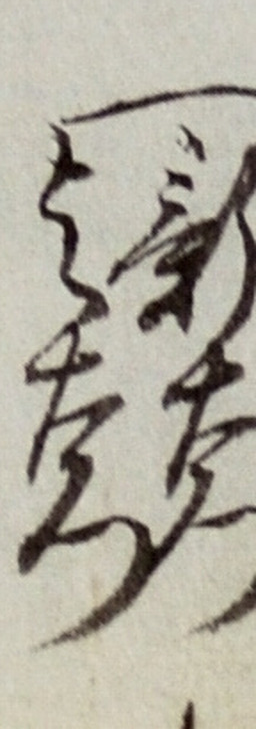与右衛門
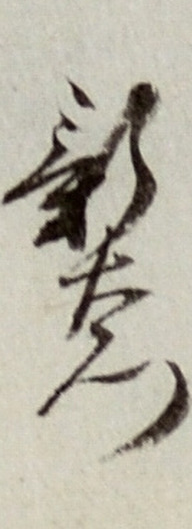忠右衛門
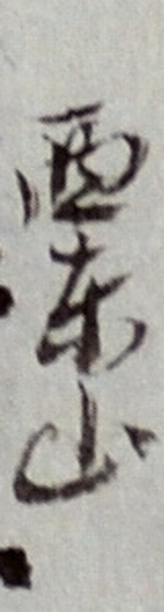西東山
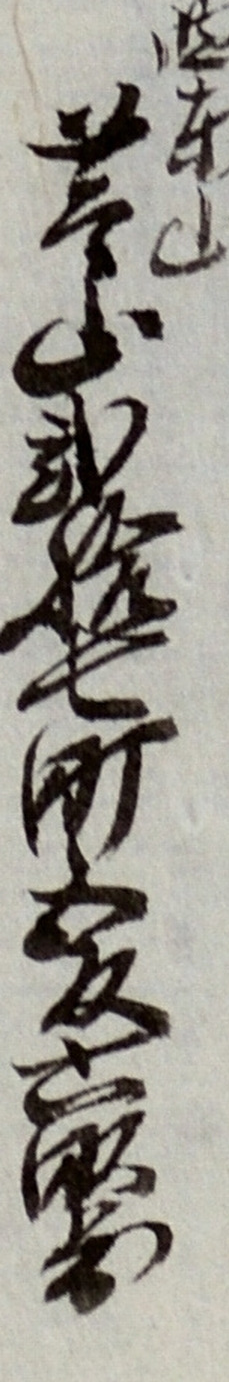芝山弐拾七町五反六畝歩村中
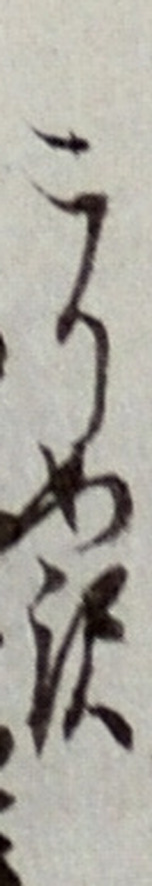こりめ沢
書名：御領分中山林社地手控
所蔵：伊那市立高遠町図書館・合同会社AMANE
